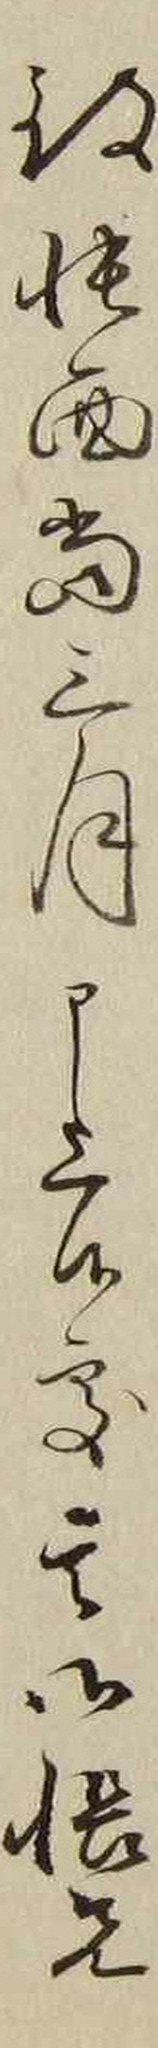致帳面当三月申上候処其御帳先
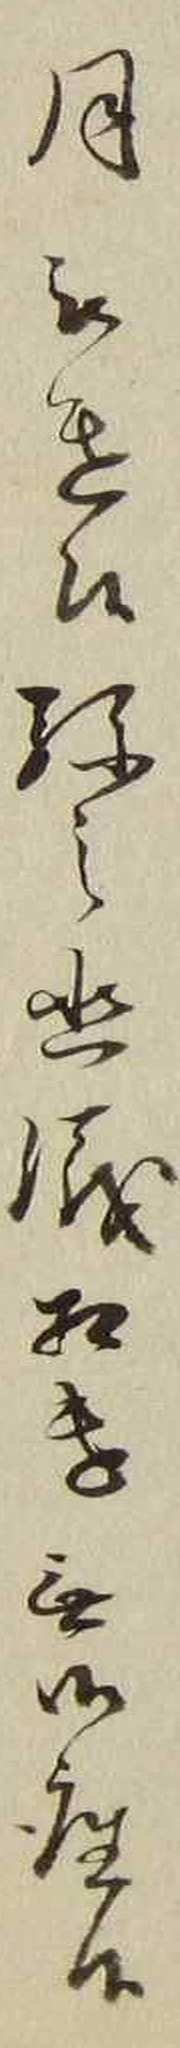月被遣候弥之丞儀相遣無御座候
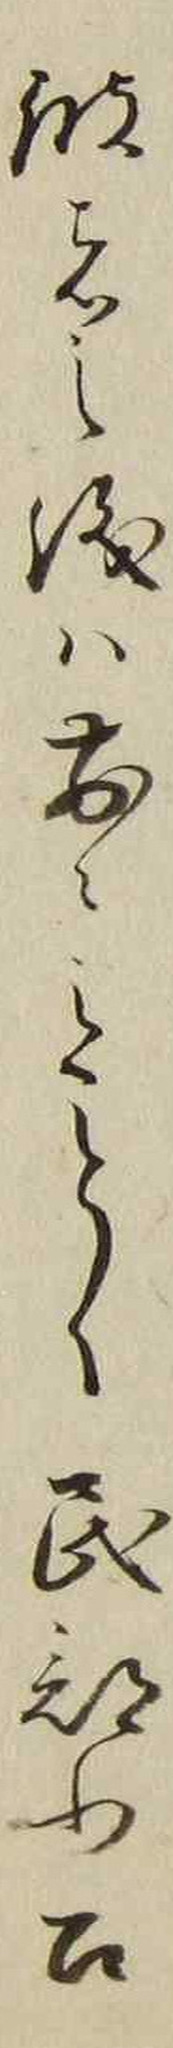彼者之儀ハ前々之ことく民部少召

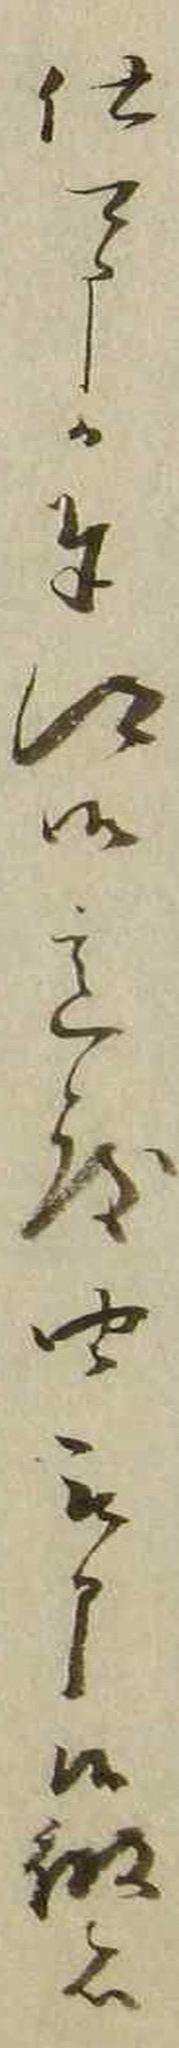仕可申候奉存御意度由被申被申候段者
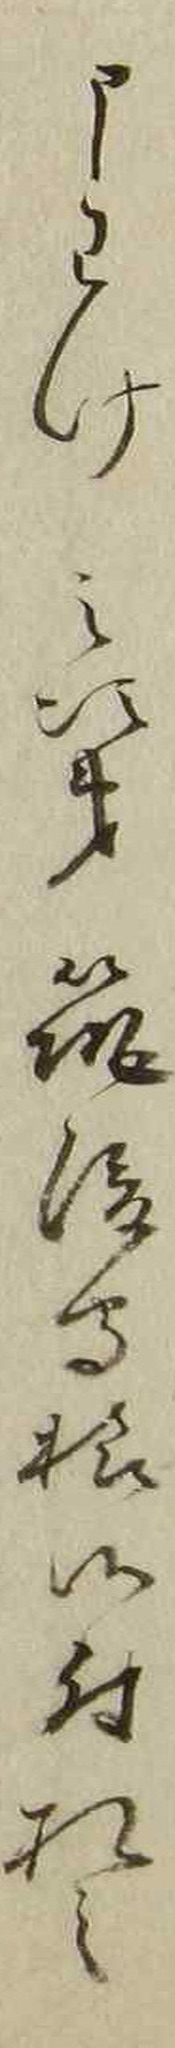申しわけ之次第築後守様御付礼之
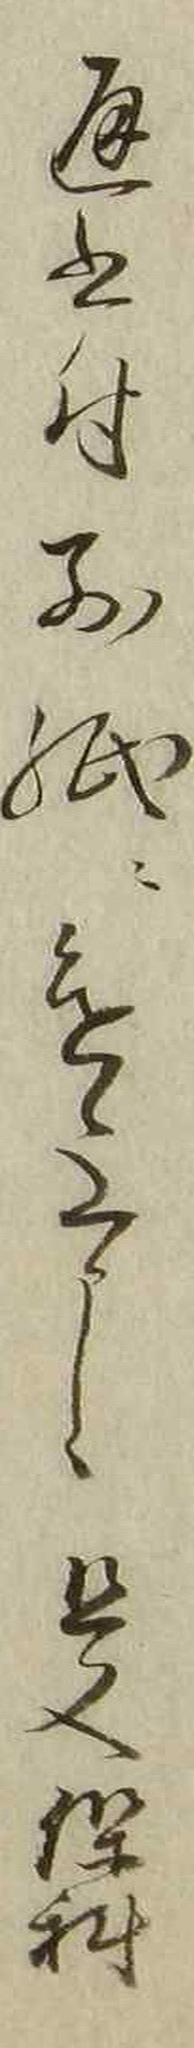通書付別紙ニ進上申候且又保科
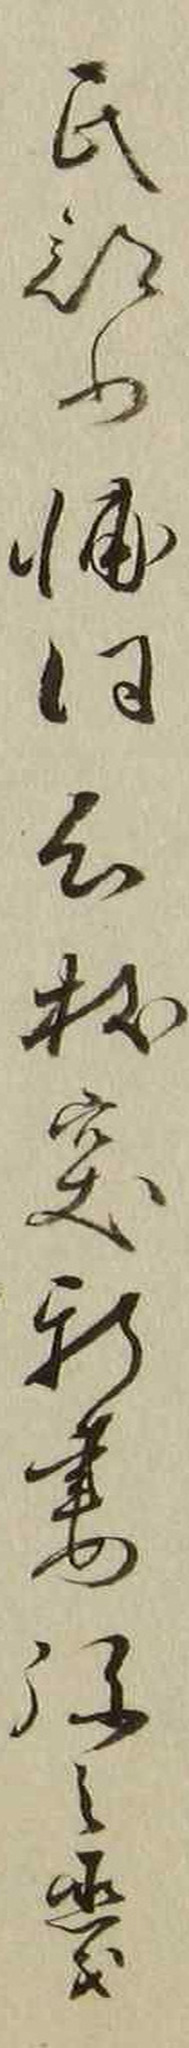民部少輔同心杖突新妻弥之丞義
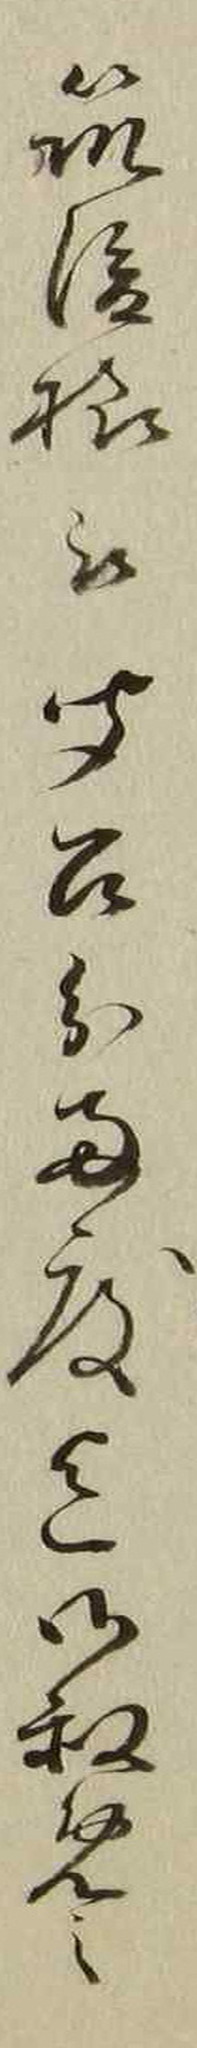築後様被聞召分両度迄御私見之
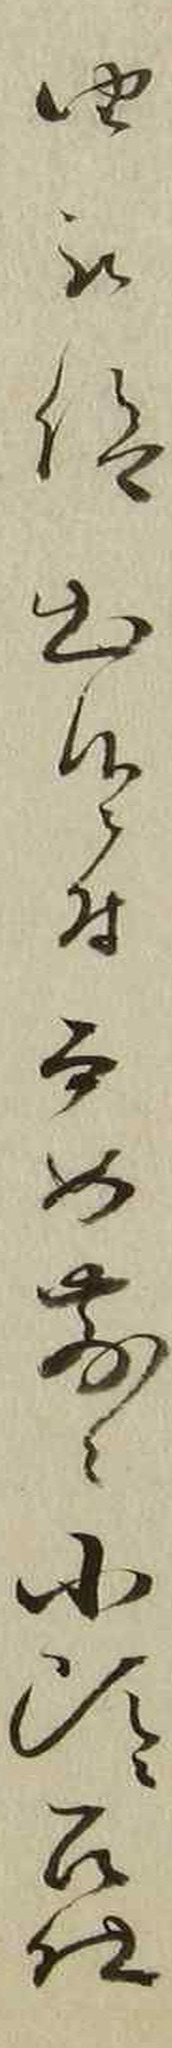由被仰出候ニ付而め前ニ小頭召仕
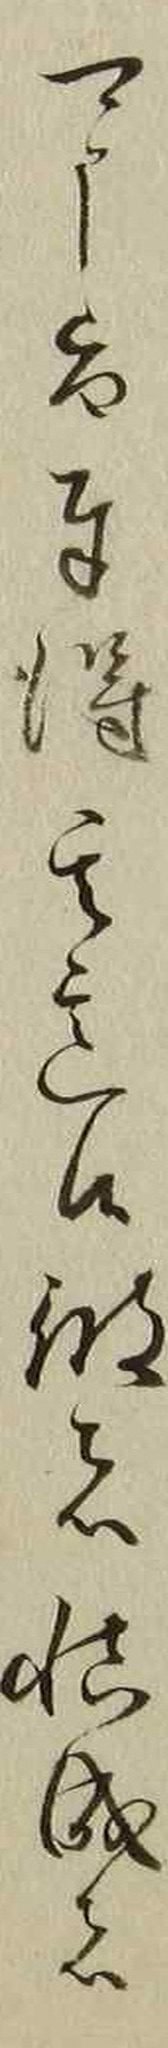可申旨奉得其意候彼者慥成者
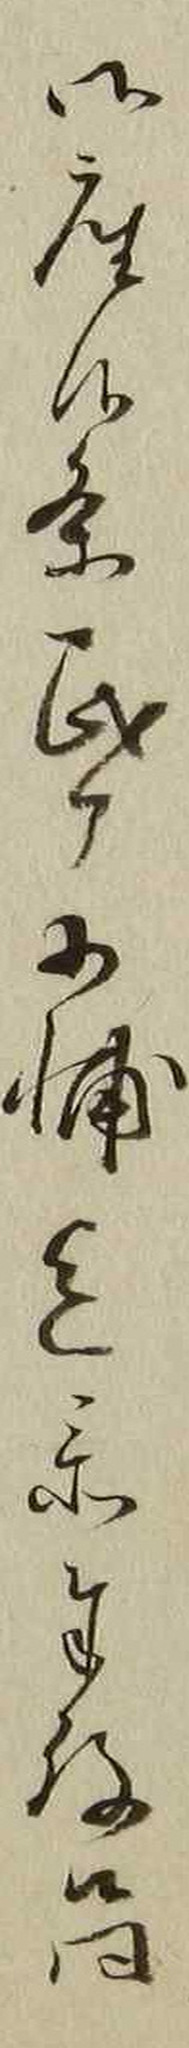御座候条民部少輔迄参奉存候同
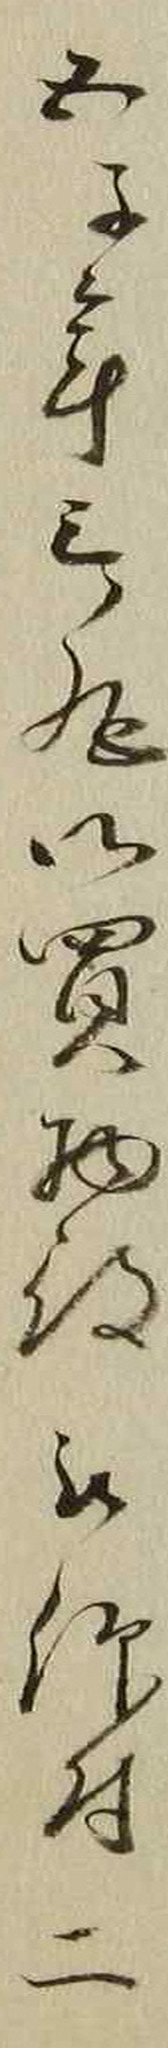五子年三ノ丸御買物役被仰付二
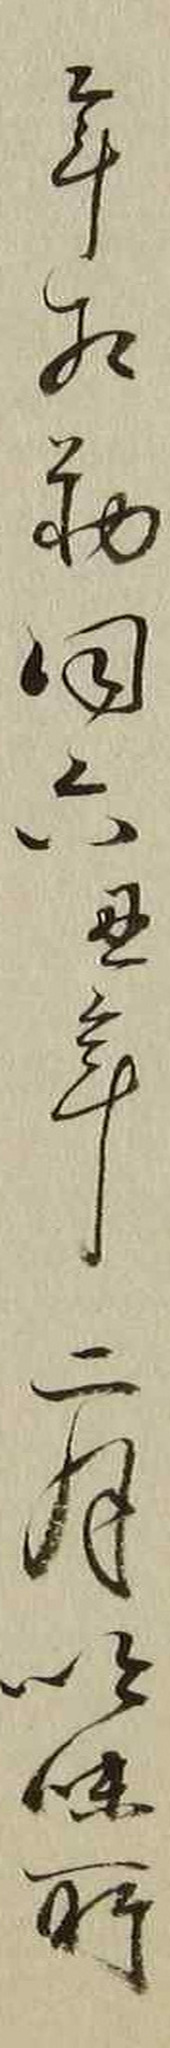年相勤同六丑年二月吟味所
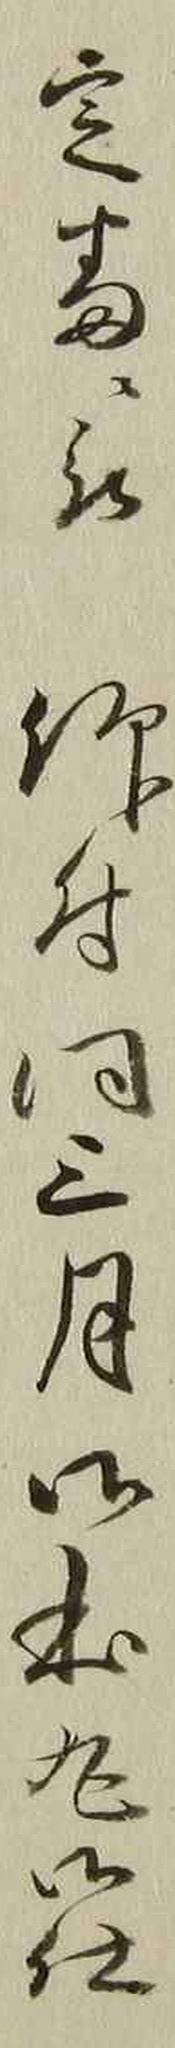定番ニ被仰付同三月御本丸御仕
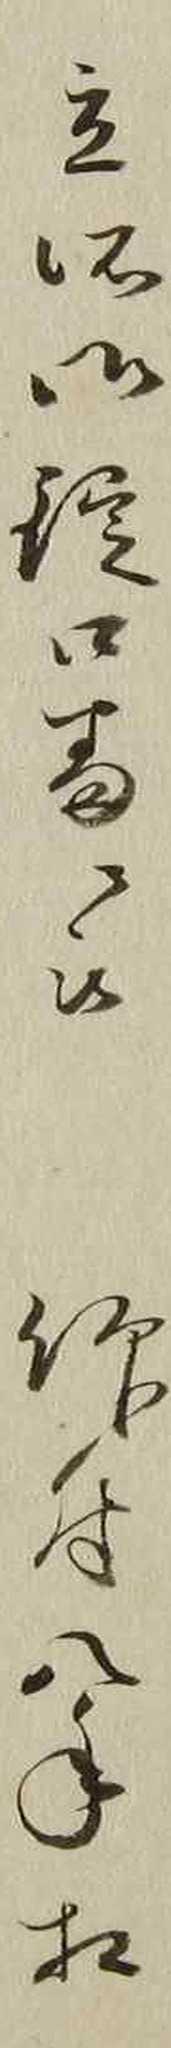立所御錠御番ニ被仰付八年相
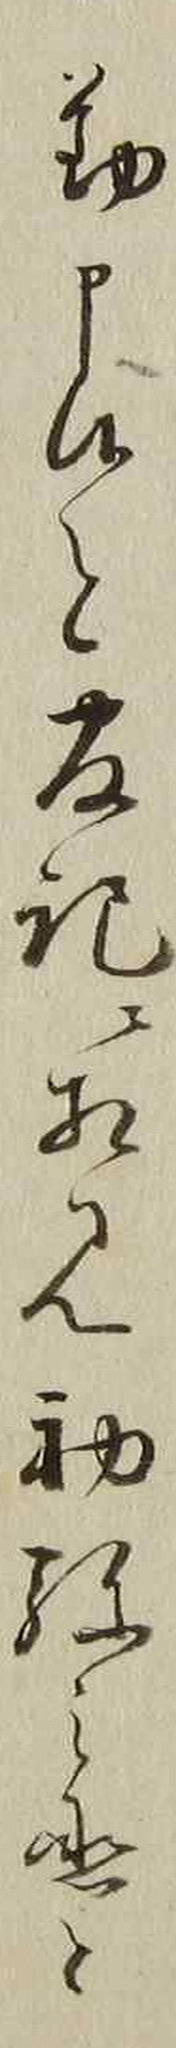勤申候と官記ニ相見初弥之丞と
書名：諸士系譜　巻之52　に之部3
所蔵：会津若松市立会津図書館
